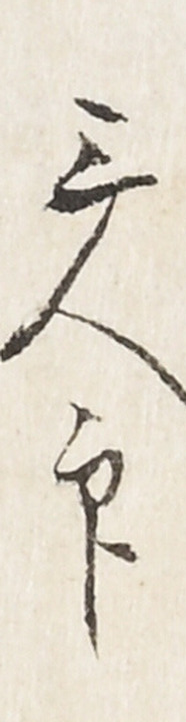三人印
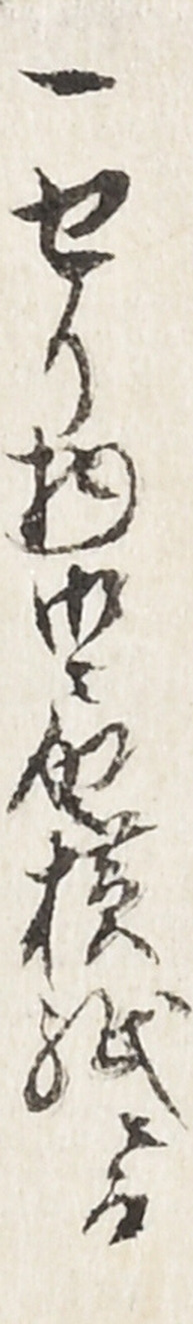一せり物御届横紙ニ而
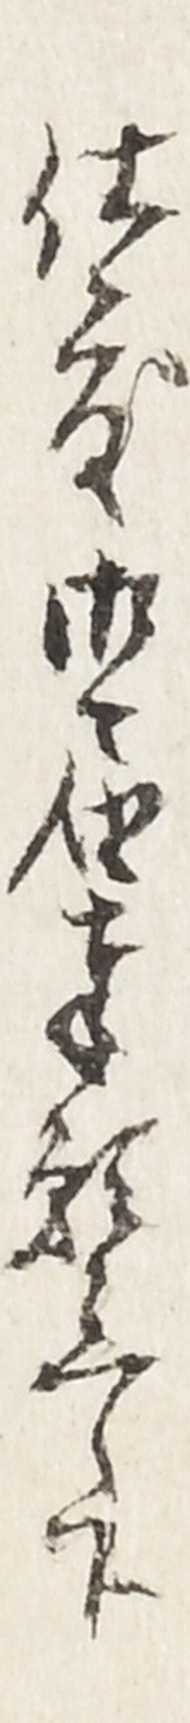仕度御届奉願上候以上

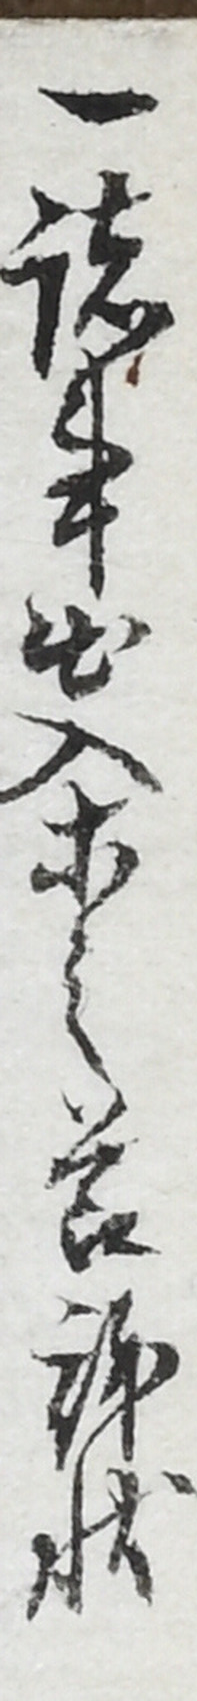一諸事出入等之節訴状
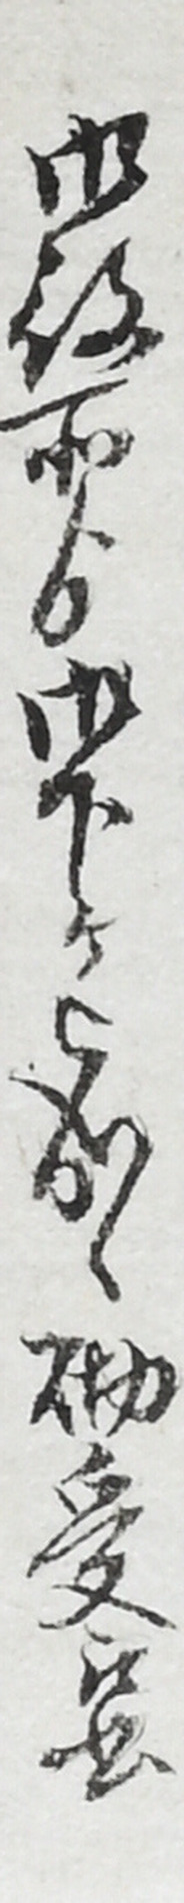御役所ゟ御下ケ被成候砌受被出
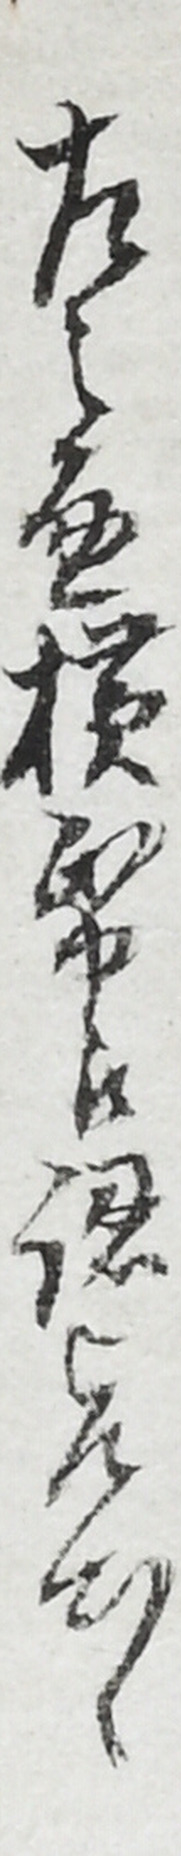左之通横不申え認差出候
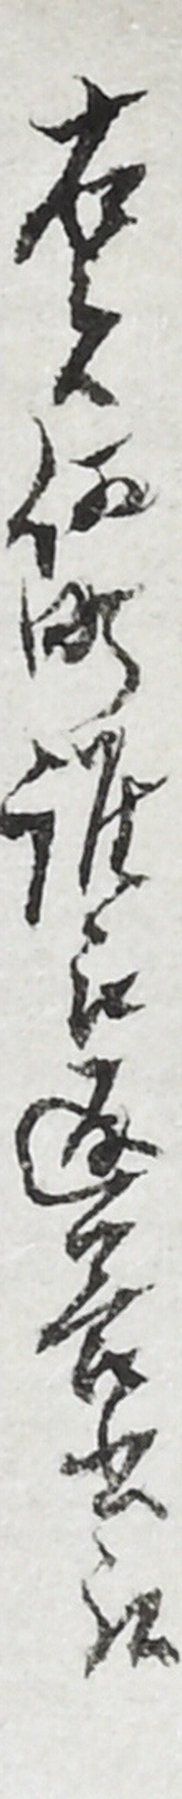右は何町誰被返答書被
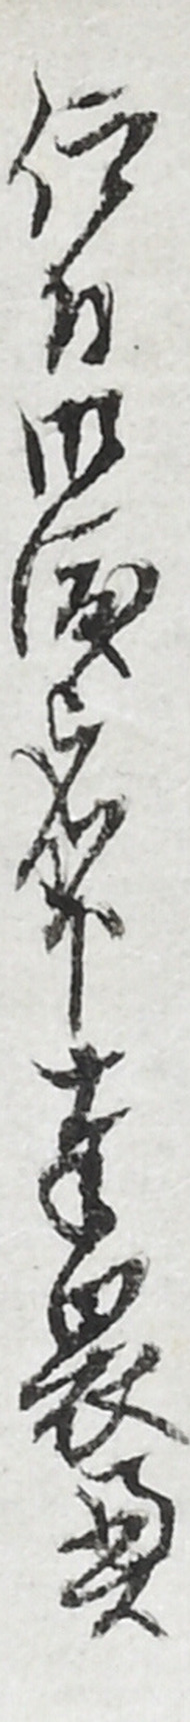仰付御渡被成下奉畏奥
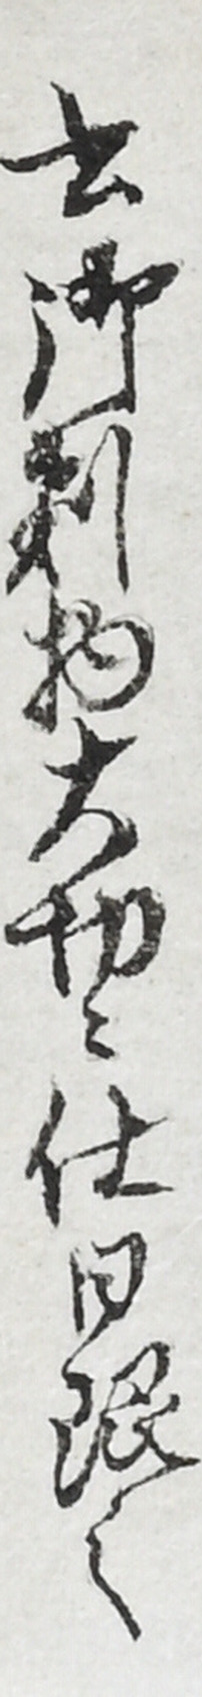書御判物大切ニ仕日限之
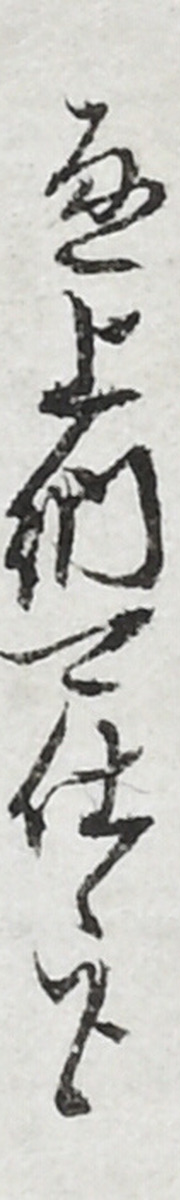通上納可仕候以上
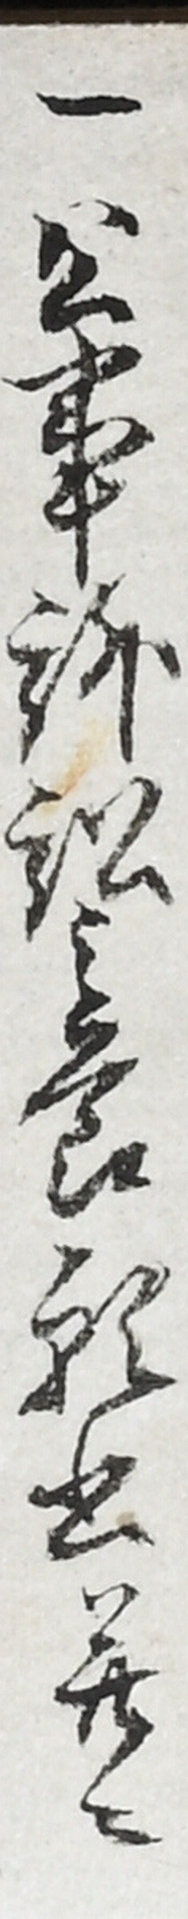一公事訴訟之節願書并ニ
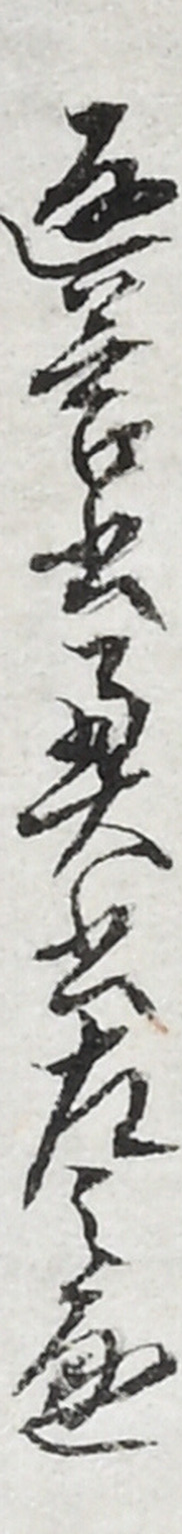通答書奥書左之通
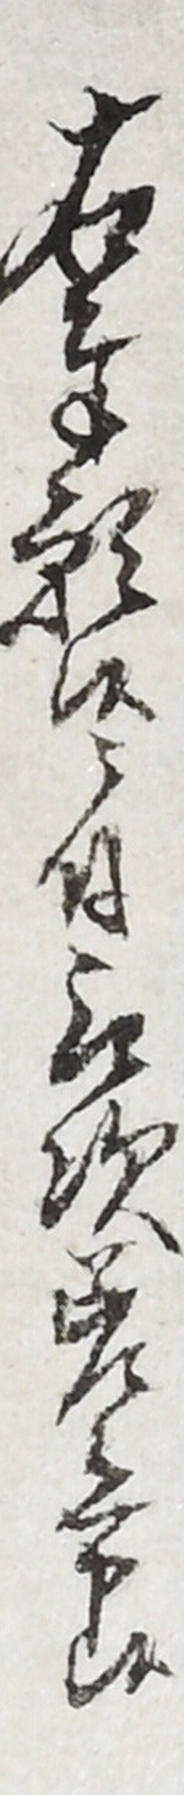右奉願候ニ付取次差立申候
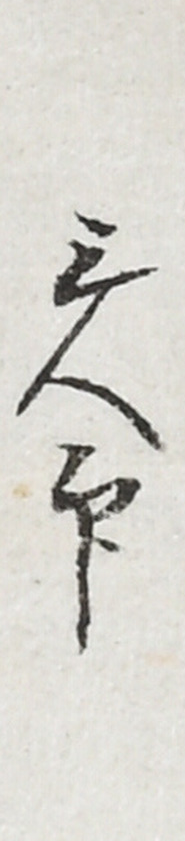三人印
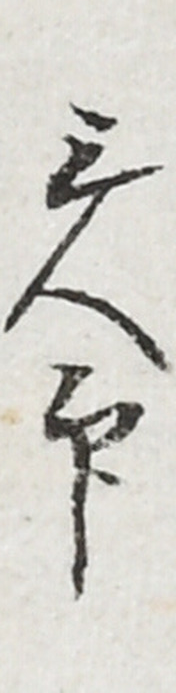三人印
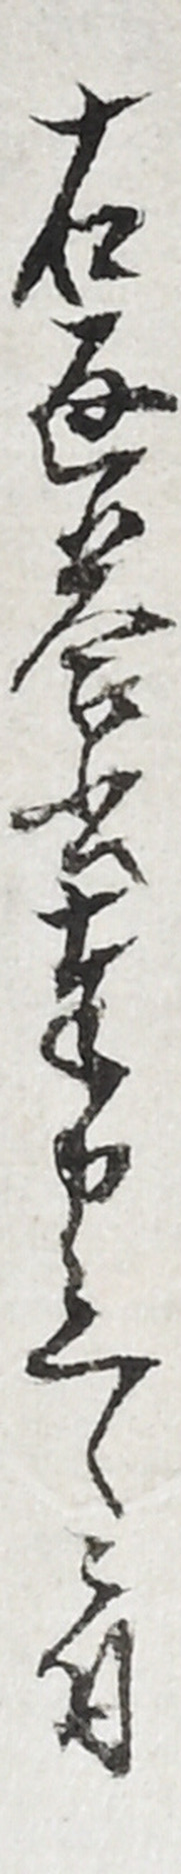右通答書奉申上候ニ付
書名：年内行事懐中録
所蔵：伊那市立高遠町図書館・合同会社AMANE
